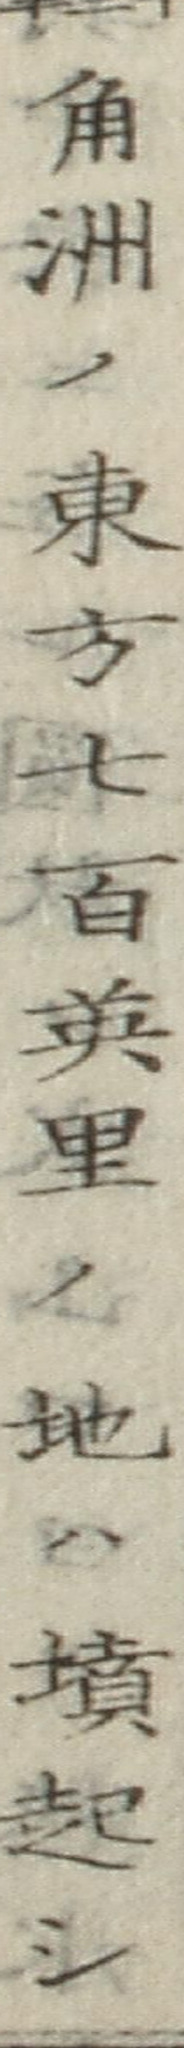角洲ノ東方七百英里ノ地ハ墳起シ
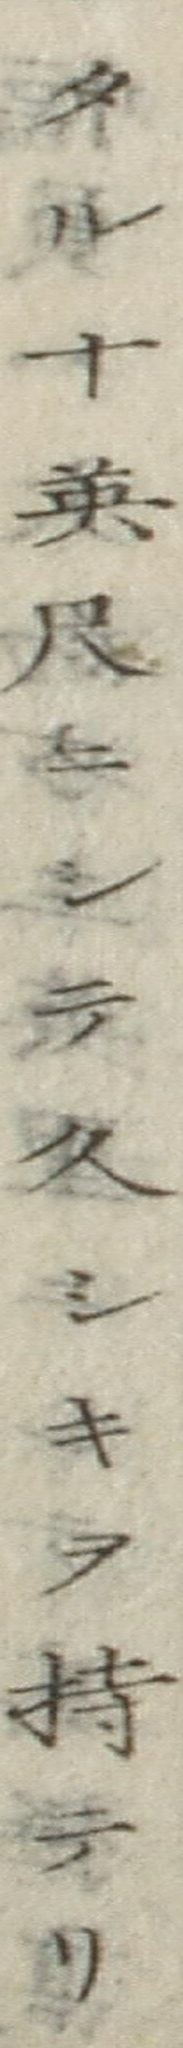タル十英尺ニシテ久シキヲ持テリ
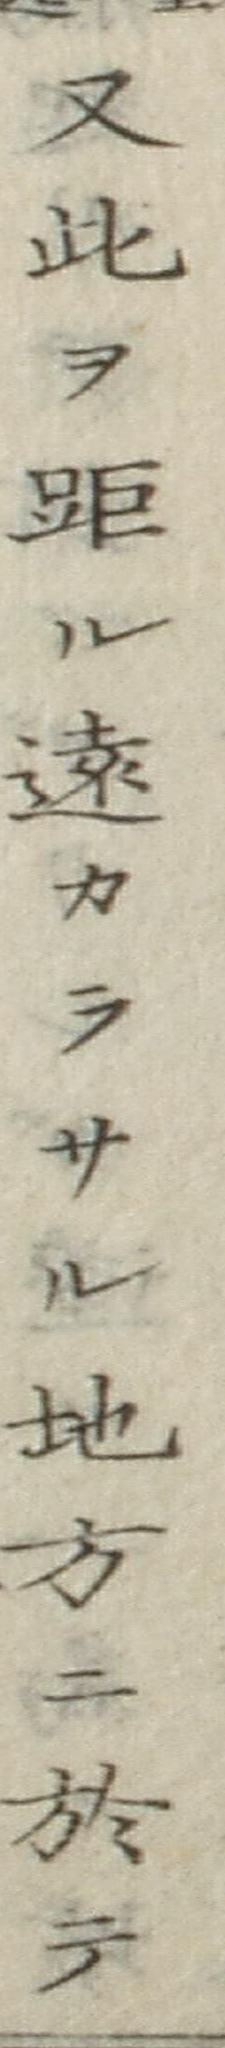又此ヲ距ル遠カラサル地方ニ於テ
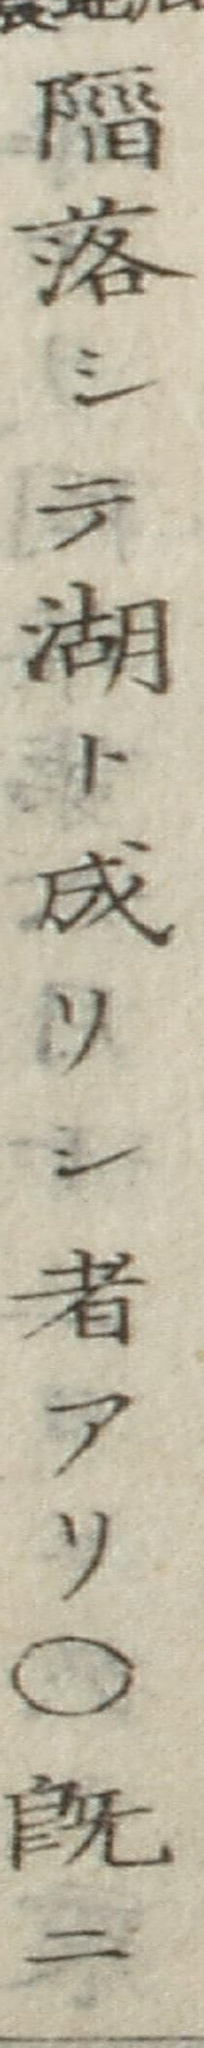陥落シテ湖ト成リシ者アリ○既ニ
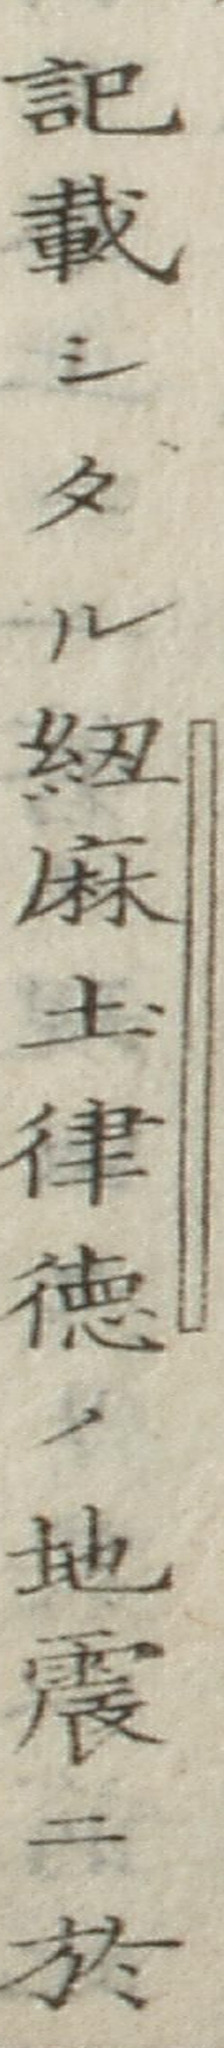記載シタル紐麻土律徳ノ地震ニ於
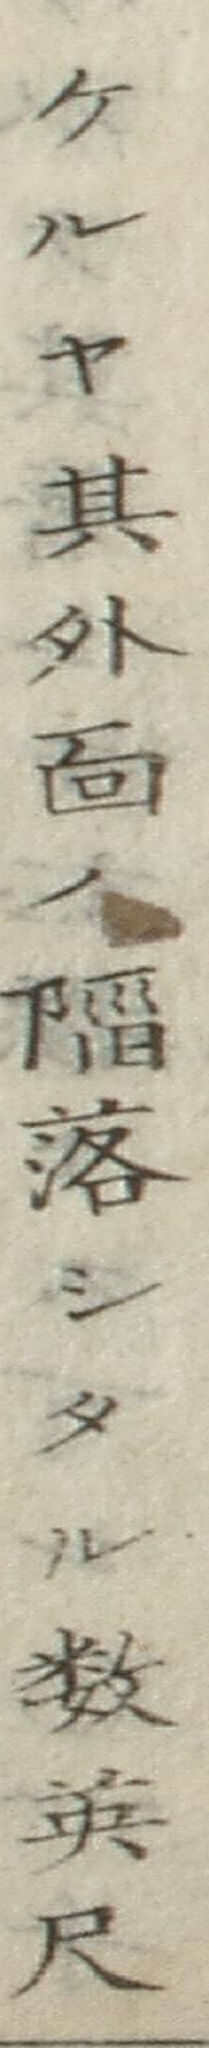ケルヤ其外面ノ陥落シタル数英尺
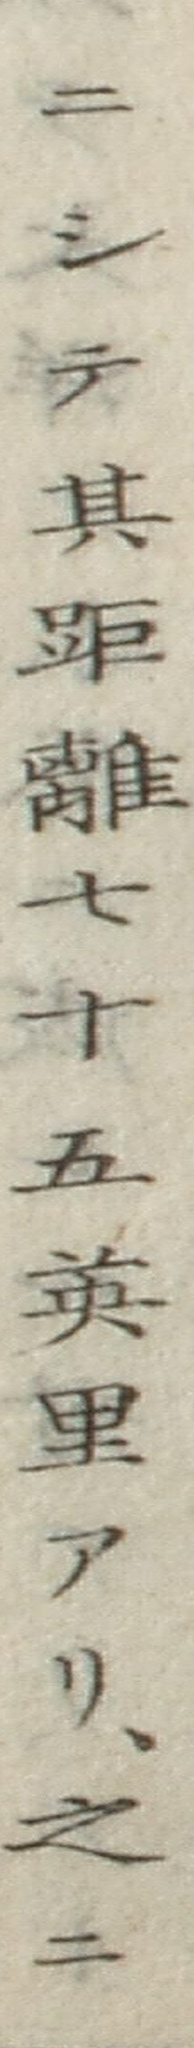ニシテ其距離七十五英里アリ、之ニ
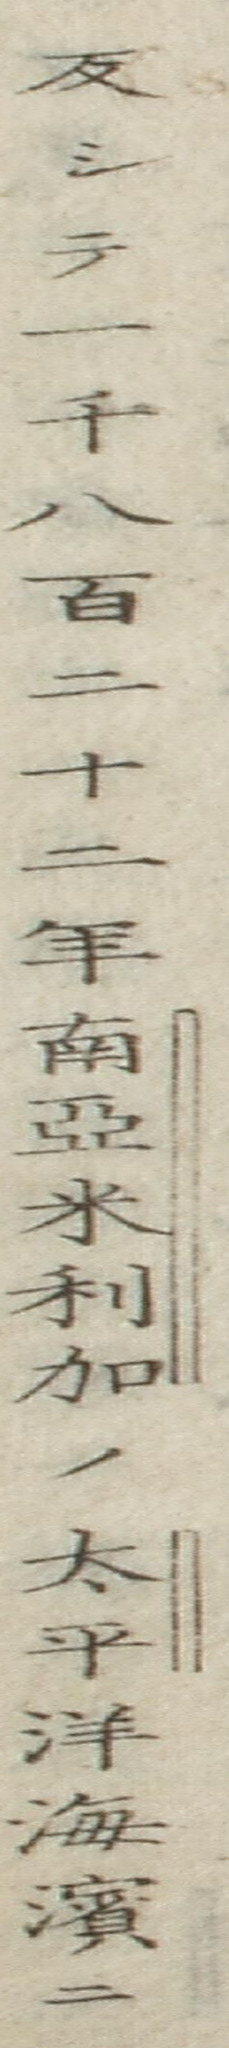反シテ一千八百二十二年南亜米利加ノ太平洋海浜ニ
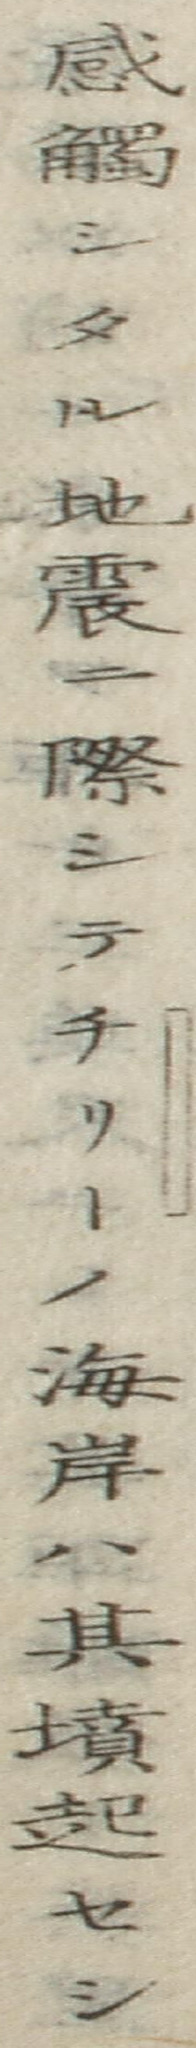感触シタル地震ニ際シテチリーノ海岸ハ其墳起セシ

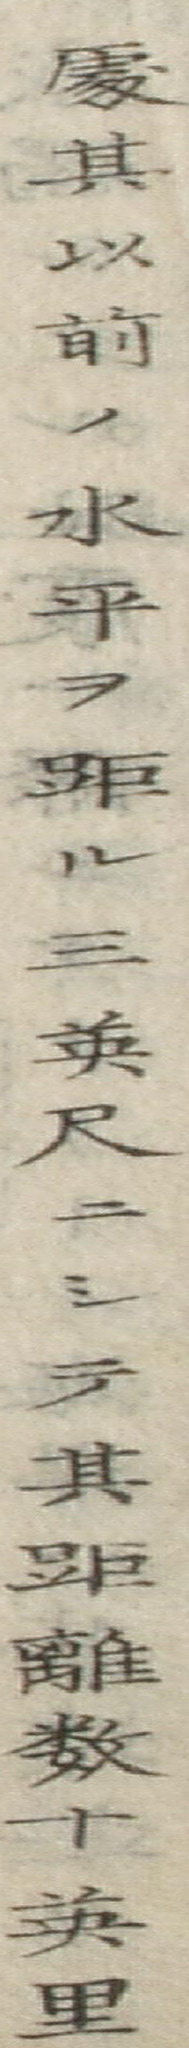處其以前ノ水平ヲ距ル三英尺ニシテ其距離数十英里
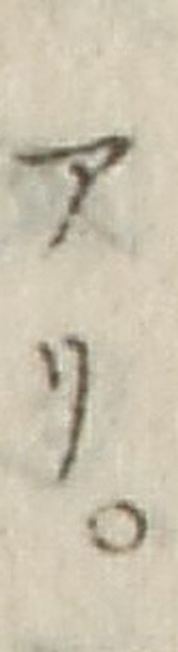アリ。
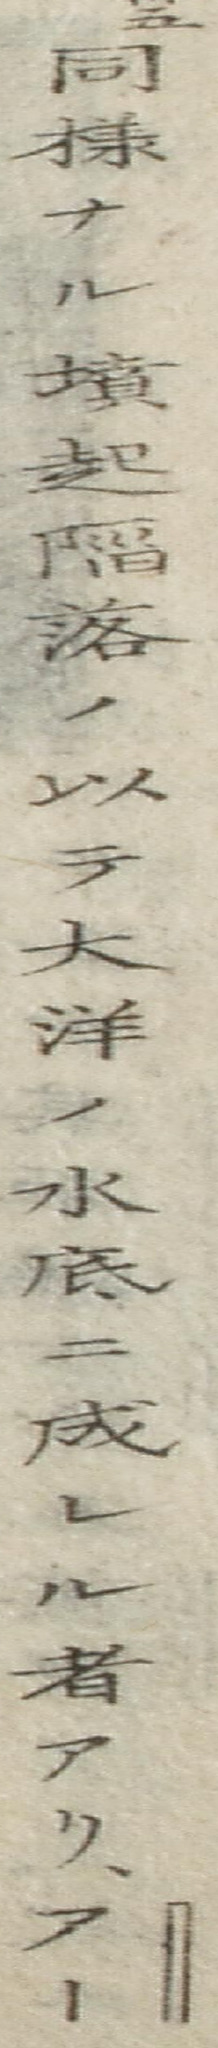卅五同様ナル墳起陥落ノ以テ大洋ノ水底ニ成レル者アリ、アー
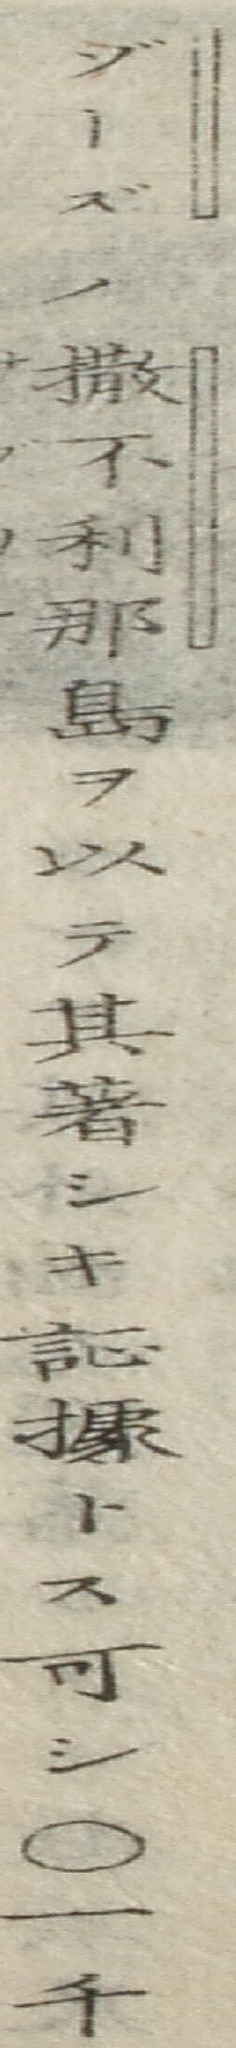ゾーズノ撒不利那島ヲ以テ其著シキ証拠トス可シ○一千
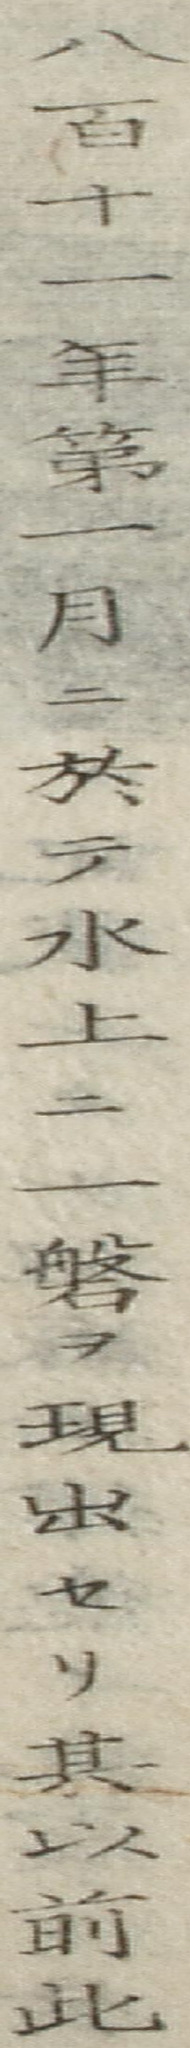八百十一年第一月ニ於テ水上ニ一磐ヲ現出セリ其以前此
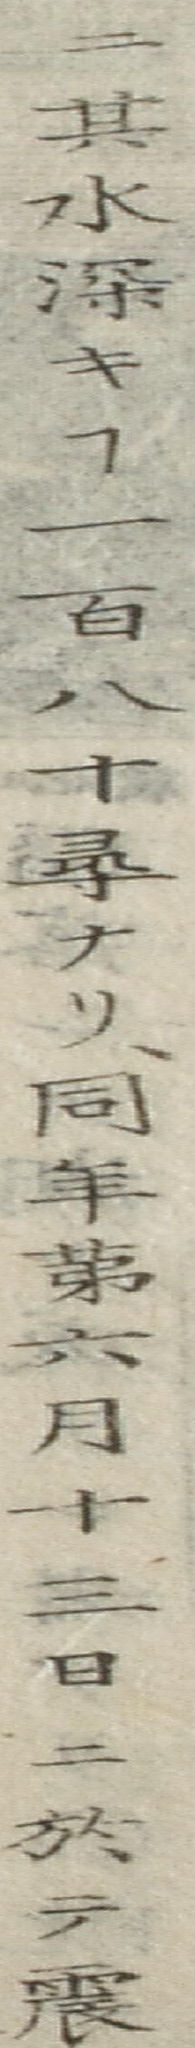ニ其水深キヿ一百八十尋ナリ、同年第六月十三日ニ於テ震
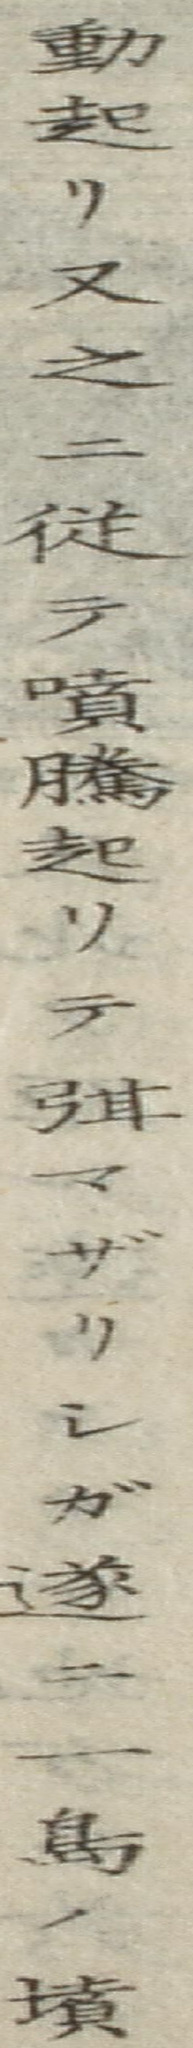動起リ又之ニ従テ噴騰起リテ弭マザリシガ遂ニ一島ノ墳
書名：地形論　巻二
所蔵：東京大学地震研究所図書室 Earthquake Research Institute Library, The University of Tokyo, JAPAN
